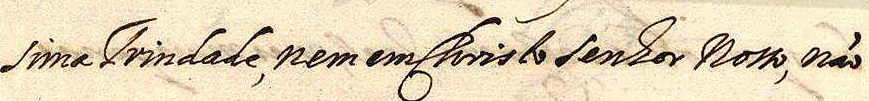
sima Trindade, nem em Christo Senhor Nosso, naõ
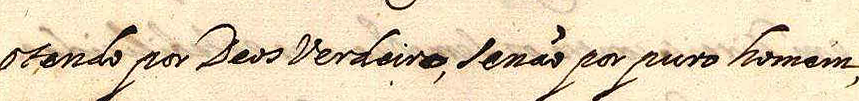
o tendo por Deos verdadeiro, senaõ por puro homem,
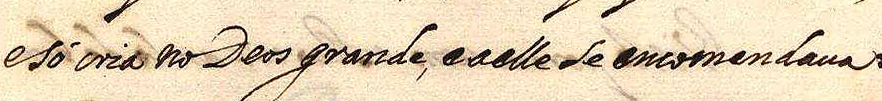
e só cria no Deos grande, e a elle se encomendaua
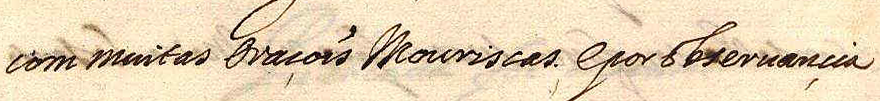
com muitas Oraçoẽs Mouriscas. E por obseruançia
